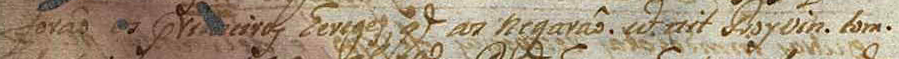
foraõ os pri_eiros hereges, q̄ as negaraõ: ut ait Poyvin. tom.
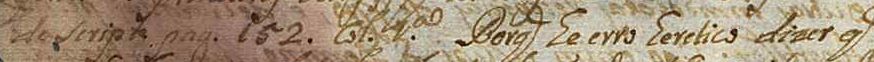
de script pag. 152. col. 4.a Porq he erro heretico dizer q̄
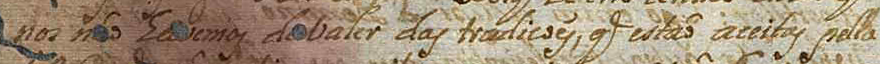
nos n_õ havemos d_ valer das tradicoẽs, q̄ estaõ aceitas pella
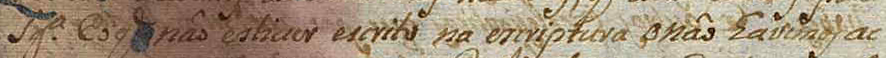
Ig.ra E o q̄ o naõ estiuer escrito na escriptura o não havemos ac
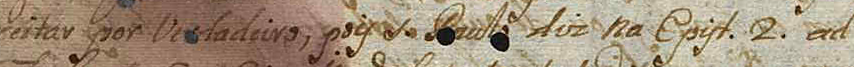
eitar por Ve_dadeiro, pois s. Paulo diz na Epist. 2. ad
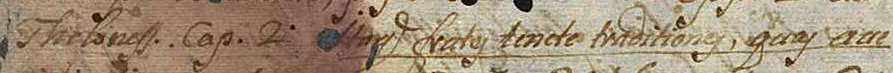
Theloness. Cap. 2. Itaq̄ frates tenete traditiones, quas acce
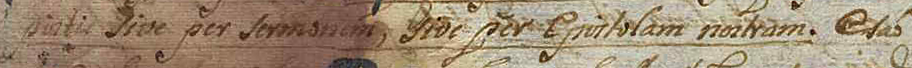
pistis sive per sermonem, sive per Epistolam nostram. E saõ
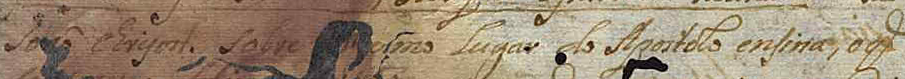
Io_õ chrisost. sobre _mo Lugar do Apostolo ensina, o q̄
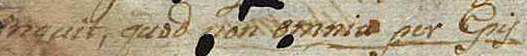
inquit, quod non omnia per Epis
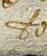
to
